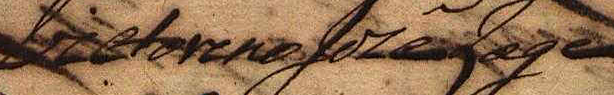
Victorino Jozé Lage
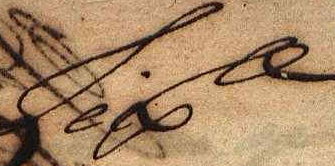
Lixa
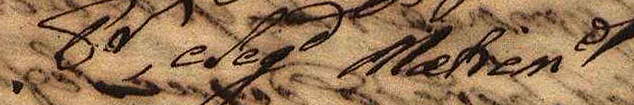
Pro, e Segdo Matrimo
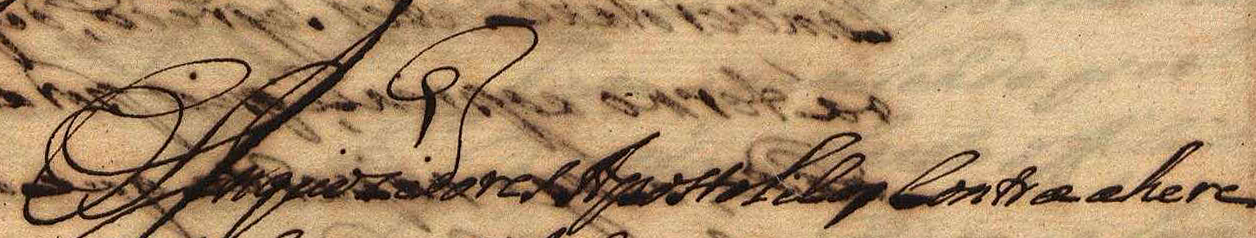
Os Jnquizidores Apostolicos Contra a here
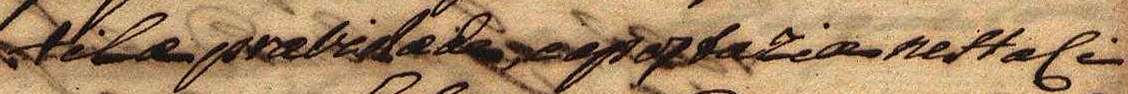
tiCa pravidade, e apoztazia nesta Ci
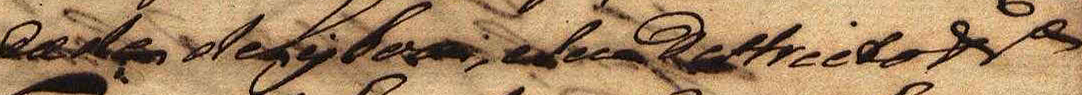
dade de Lisboa; e seu Destricto &ra
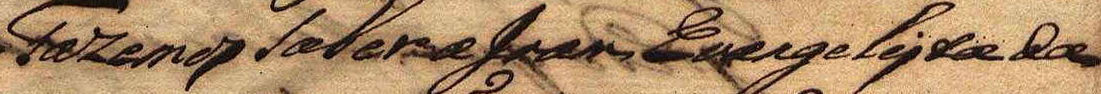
Fazemos saber a Joan Evangelista da
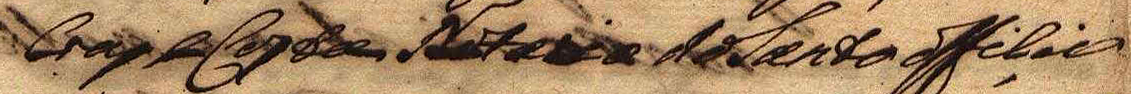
Crus e Costa Notario do Santo offiçio
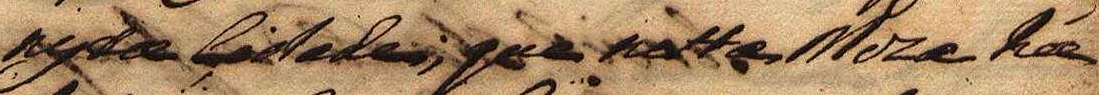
nesta Çidade; que nesta Meza há
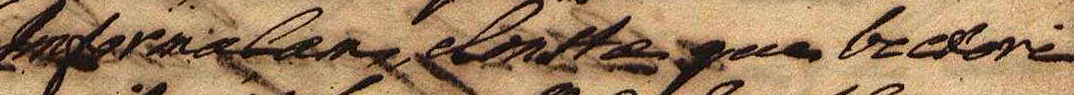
JmformaÇam, e Consta que Victori
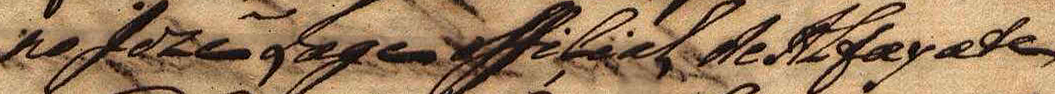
no Jozé Lage offiÇial de Alfayate,
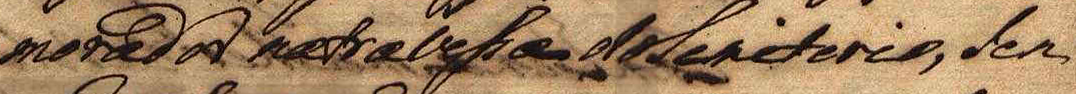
morador na travessa do Semiterio, sen
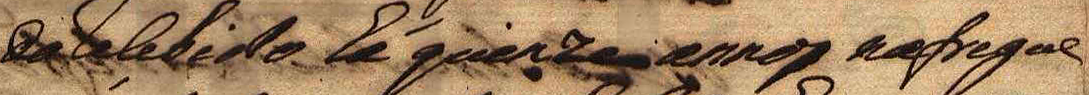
do Recebido há quinze annos na fregue
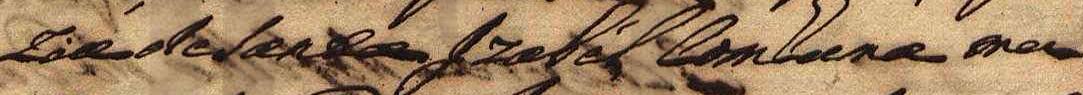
zia de Santa Jzabél Com huma mu
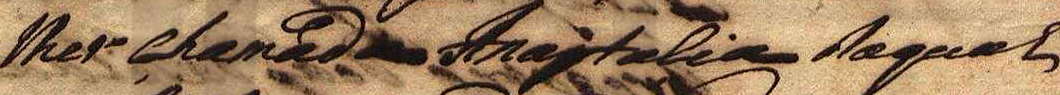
lher çhamada AnastaCia da qual
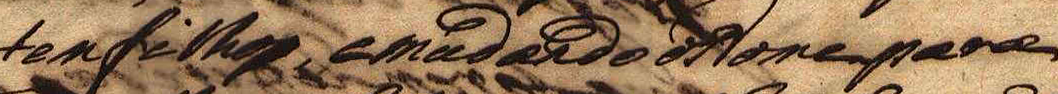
tem filhos, e mudando o nome para
